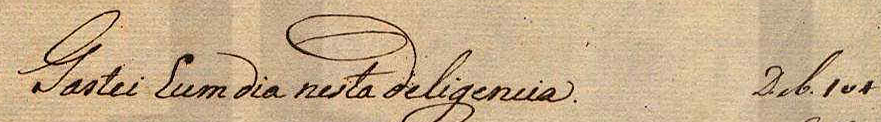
Gastei hum dia nesta deligencia. Deb. 104
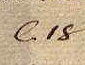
c. 18
